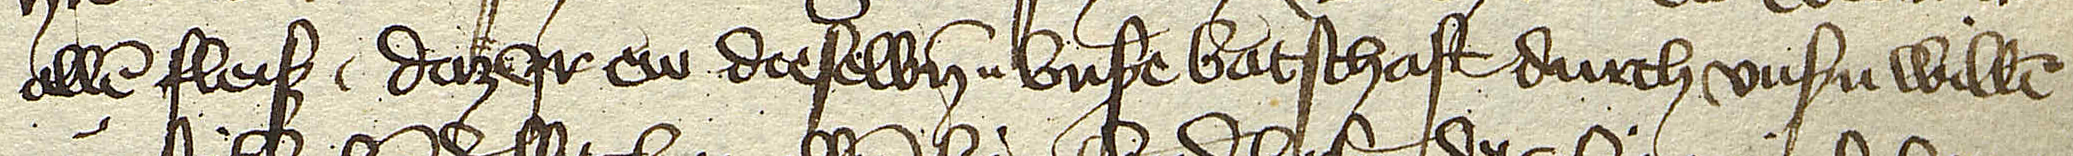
alle* fleiſʒ / daʒ Ir ew dieſelbn* ~ vnſ*e botſchaft durch vnſ*n wille*
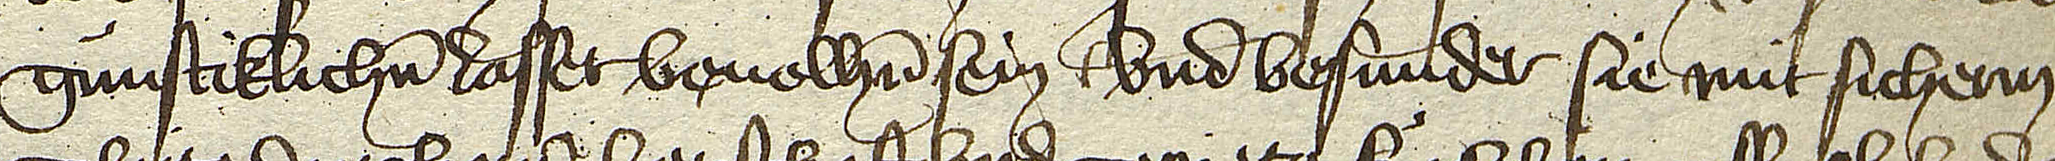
günſtiklichn* laſſet beuolhn* ſein / vnd beſunder ſie mit ſicherm
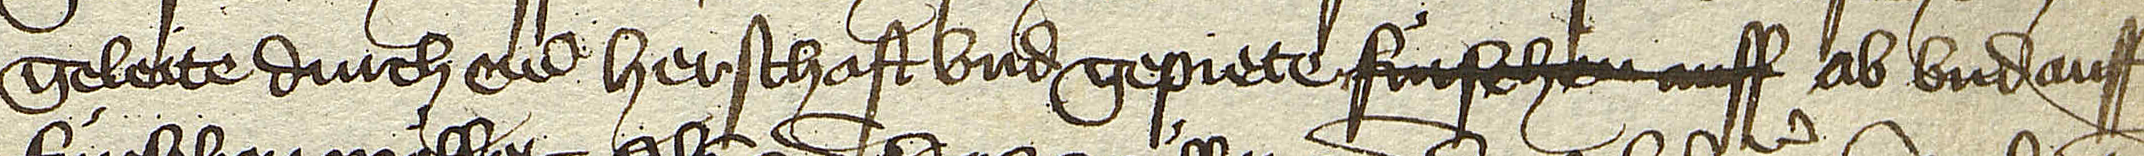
geleite durch ew* herſchaft vnd gepiete fürſehen auff ab vnd auff
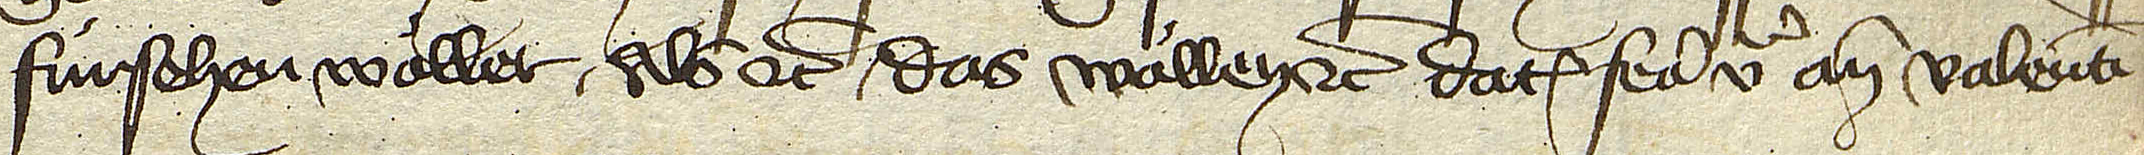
fürſehen wöllet / Als ec* / das wöllen ec* dat* fea* v* an* valenti*
